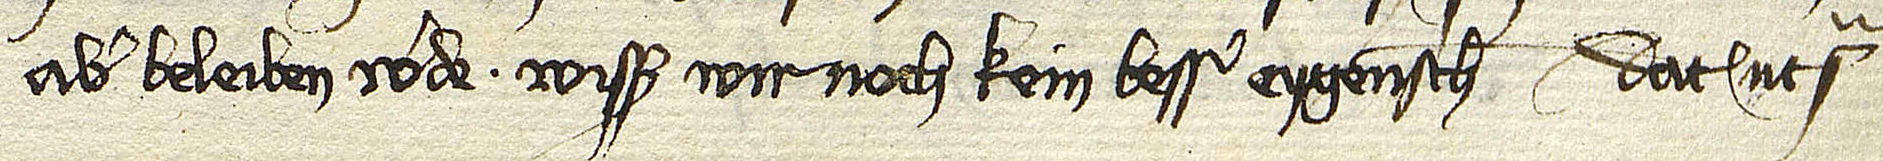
ab* beleiben w*de .wiſſ* wir noch kein beſſ* eygenſch* / dat* ut ſ*
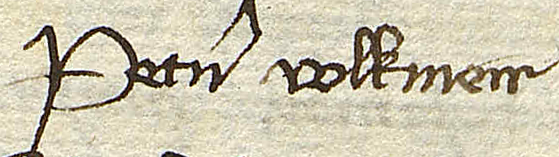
Pet*n volkmeir
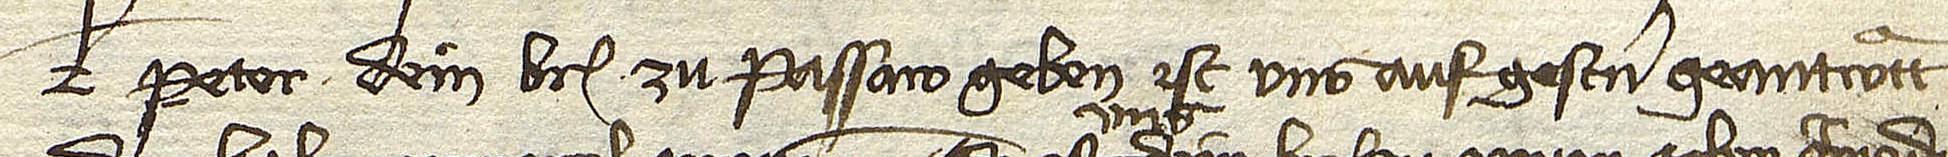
L* Peter . dein br* . ʒu Paſſaw geben iſt vns auf geſt*n geantw*tt
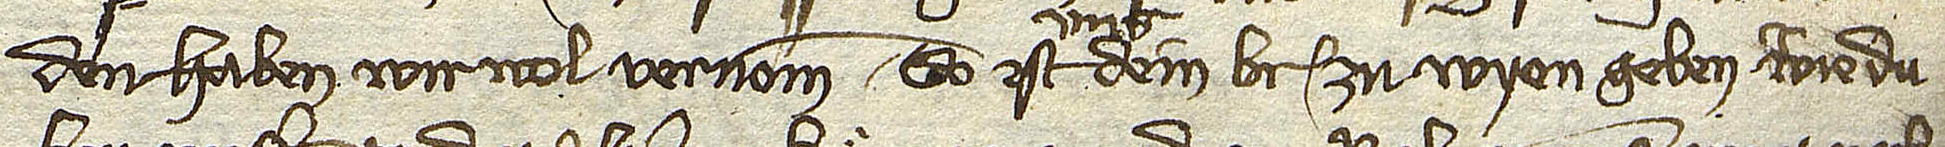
den haben wir wol vernom* / So iſt dein br* ʒu wyen geben wie du
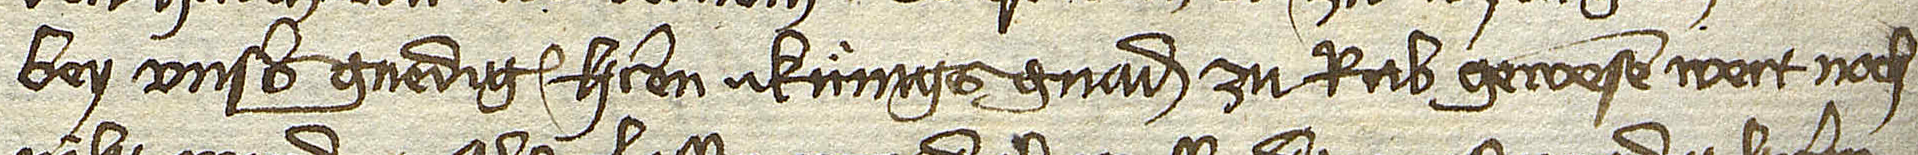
bey vnſ*s gnedig* h*ren ~ künigs gnad* ʒu Rab geweſe* wert noch
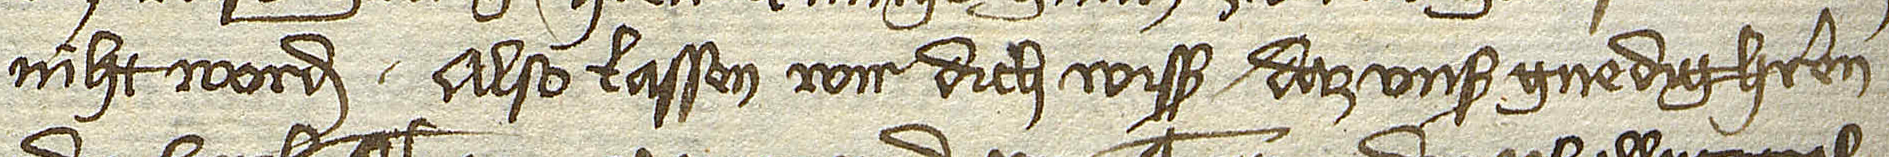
niht word* / Alſo laſſen wir dich wiſſ* / daʒ vnſ* gnedig h*ren
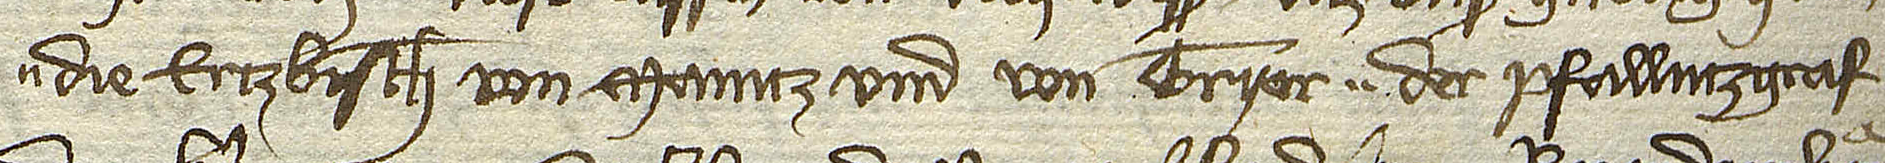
~ die Ercʒbiſch* von Maincʒ vnd von Tryer ~ der pfallncʒgraf
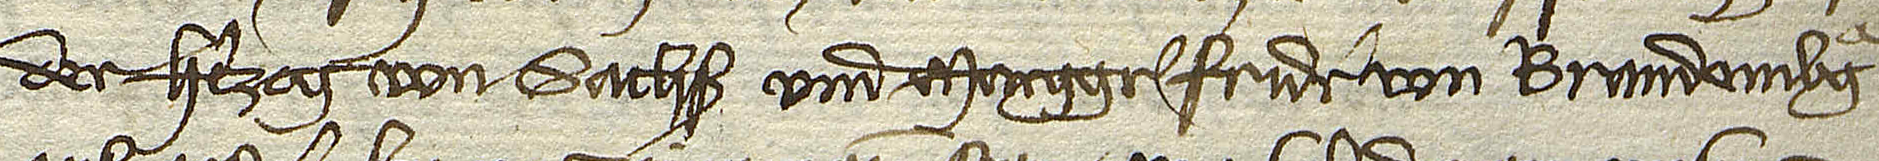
der h*cʒog von Sachſ* vnd Marggr* fridr* von Brandemb*g
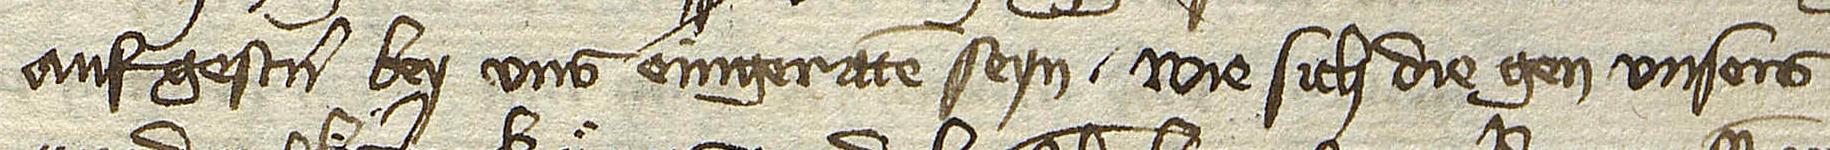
auf geſt*n bey vns eingeritte* ſeyn / wie ſich die gen vnſers
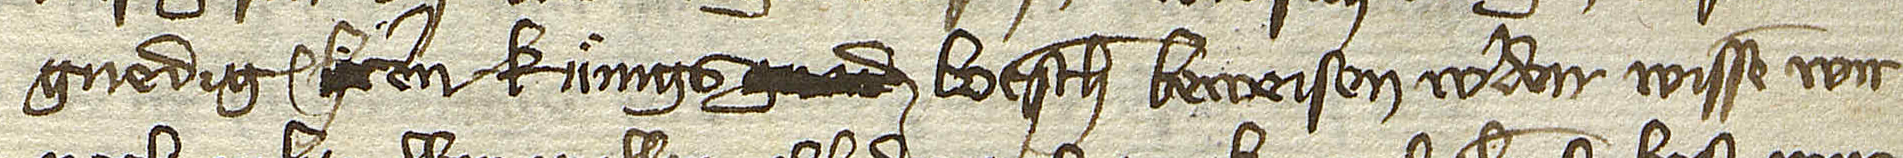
gnedig* h*ren künigs gnad* botſch* beweiſen w*den wiſſe* wir
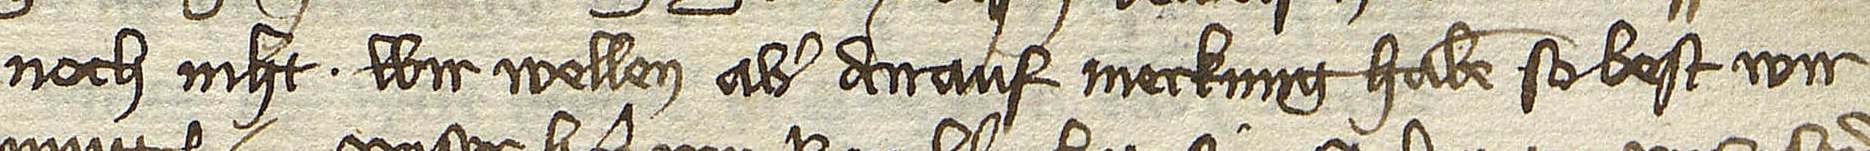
noch nicht . Wir wellen ab* darauf merkung habe* ſo beſt wir
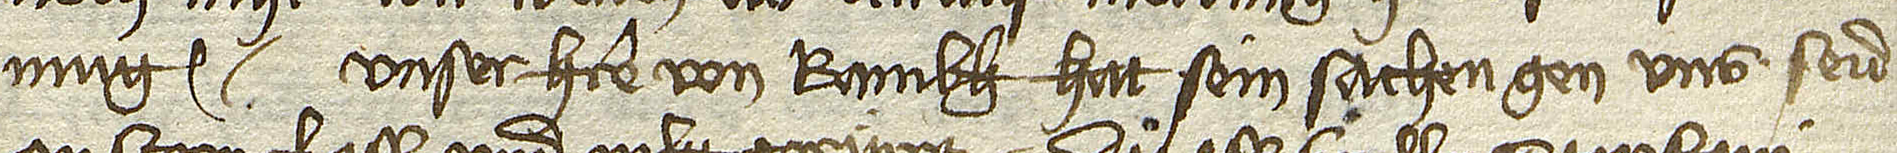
mug* / vnſer h*re von Bamb*g hat ſein ſachen gen vns . ſeid
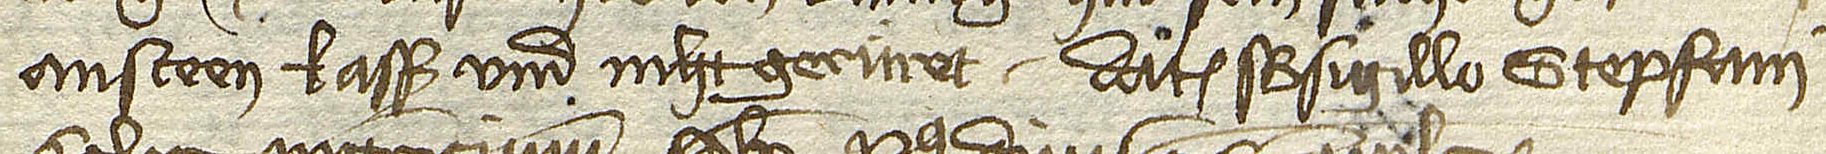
anſteen laſſ* vnd niht gerüret / dat* ſ*B ſigillo Stepfani
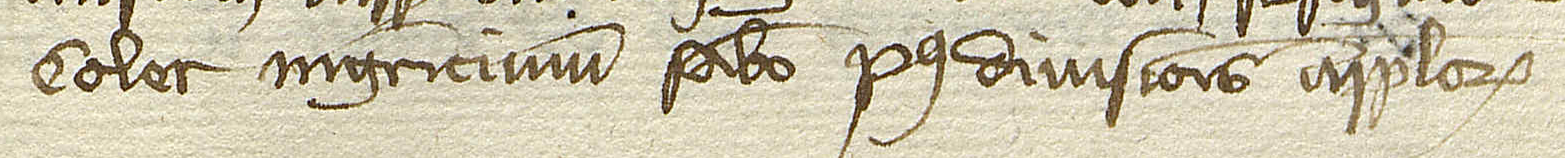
Coler m*g*r*iciuiu* ſabo* p* diuiſio*is applo*
